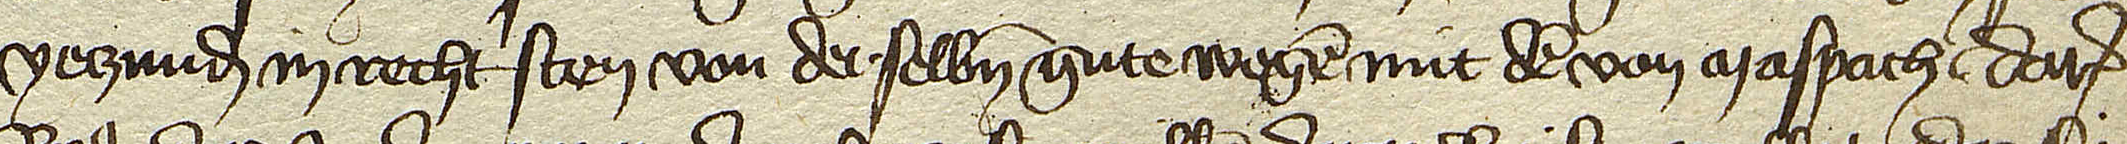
yecʒund* in recht ſten von derſelbn* gute wege* mit de* von Maſpach / dar*
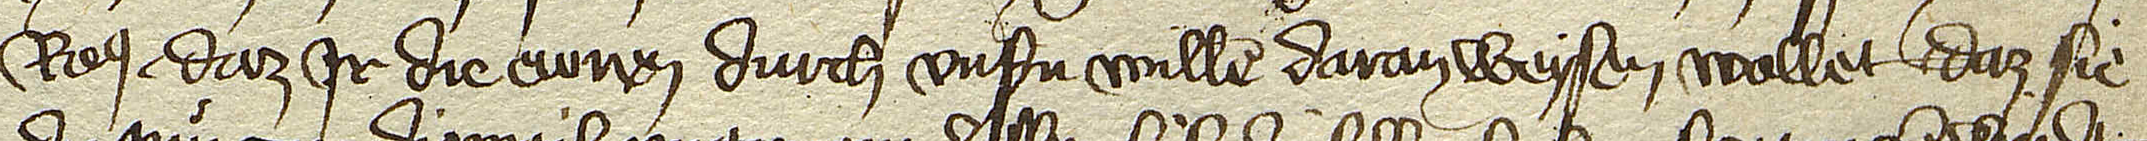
Ro* / daʒ Ir die ewren durch vnſ*n wille* daran weyſen wollet / daʒ ſie
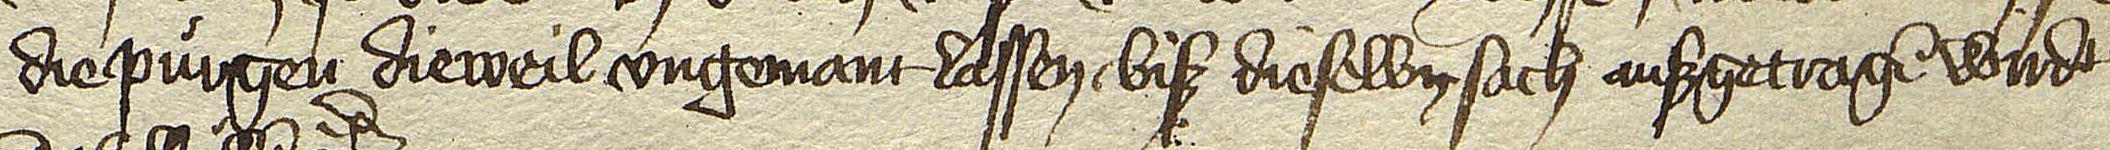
die pürgen dieweil vngemant laſſen / biſʒ dieſelbn ſach auſʒgetrage* wirdt
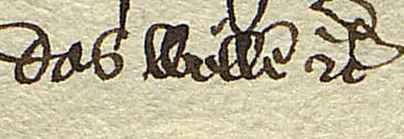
das wölle* ec*
